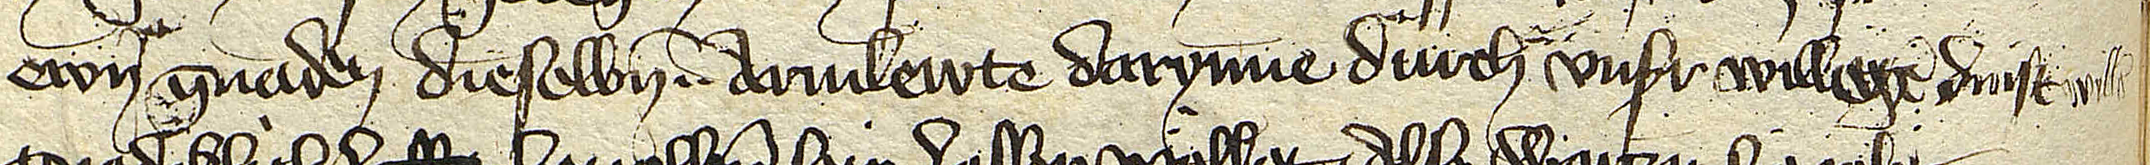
ewn* gnaden dieſelbn* ~ Armlewte darynne durch vnſ*r willige* dinſte wille*
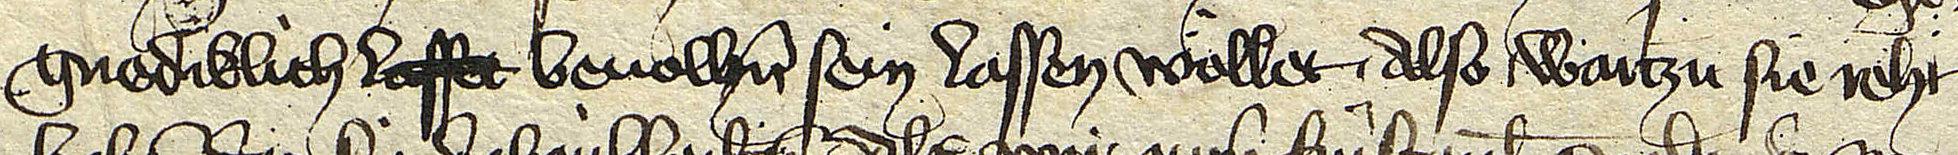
gnediklich laſſet beuolhn* ſein laſſen wöllet / Alſo / warcʒu ſie reht
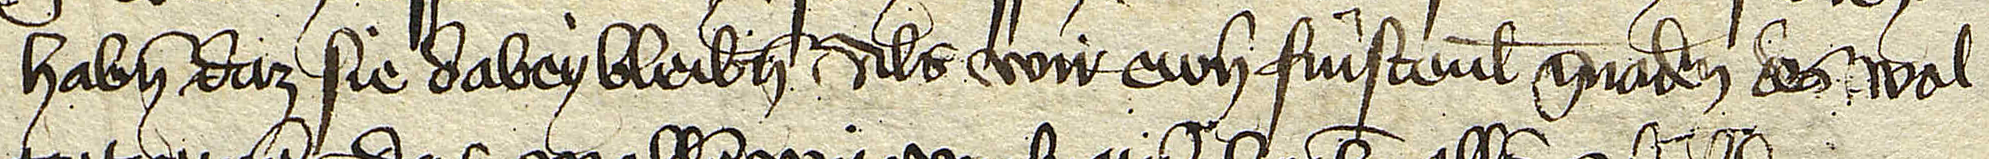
habn* / daʒ ſie dabey bleibn* / Als wir ewn* fürſtenl* gnaden des wol
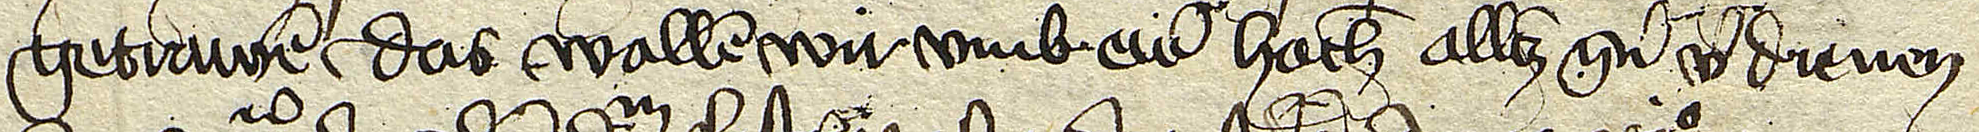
getrawe* / das wolle* wir vmb ew* hoch* allcʒ* gn* v*dienen
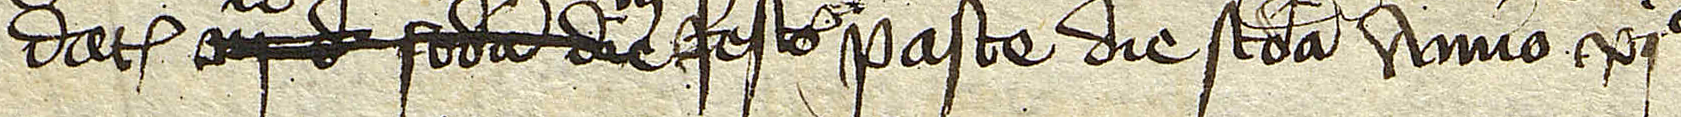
dat* iii* d* ſcda* die feſto Paſce die ſcda* Anno xi*
